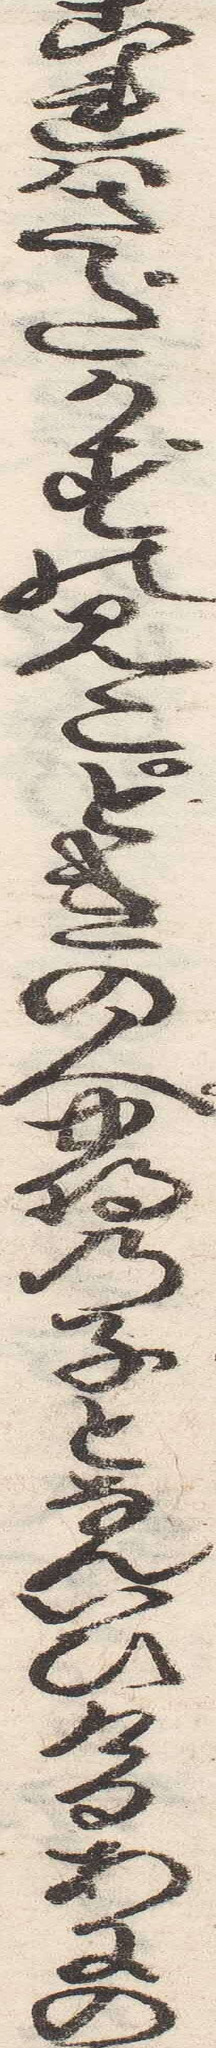これはさだかずのみこ。ときの人。中将の子となんいひけるあにの

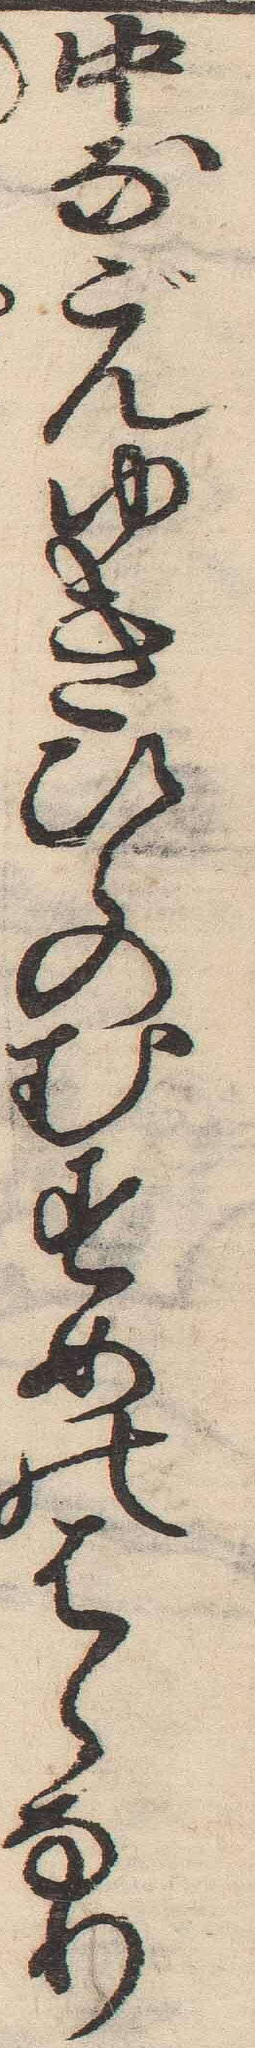中なごんゆきひらのむすめのはらなり
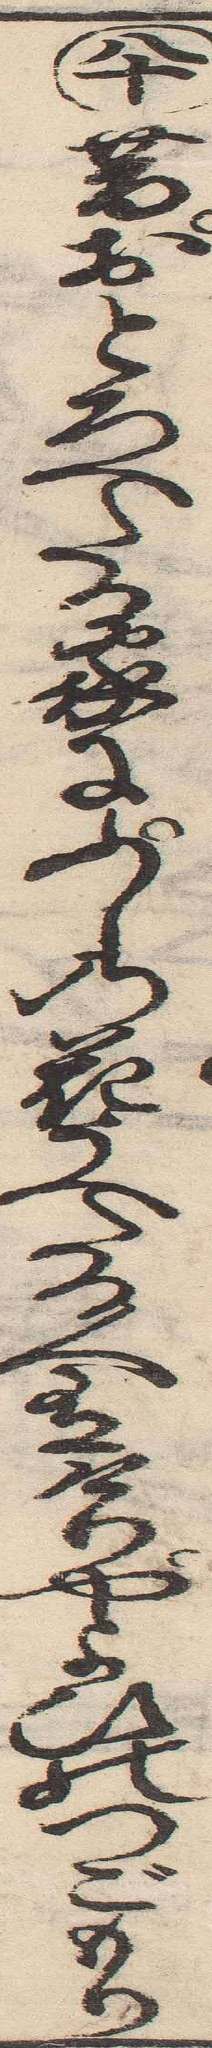八十昔。おとろへたる家に。ふしの花うへたる人有けり。やよひのつごもり
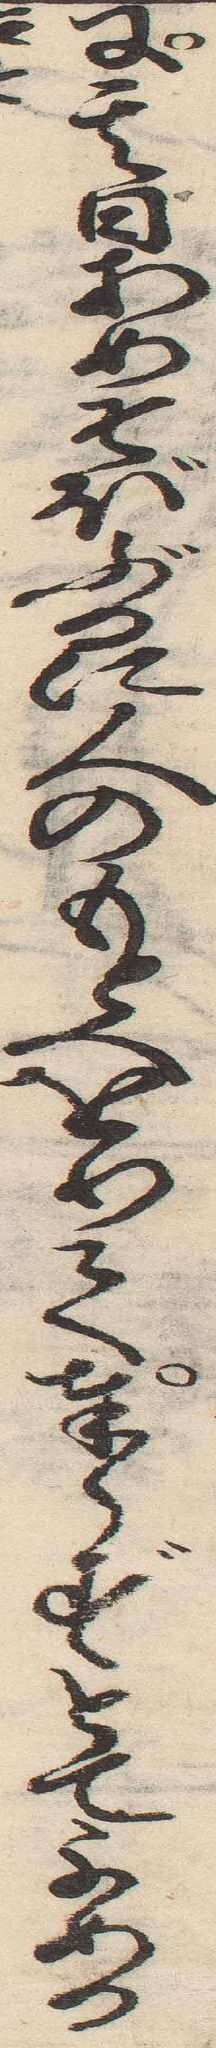に。其日あめそぼぶるに人のもとへをりて。奉らずとてよめる
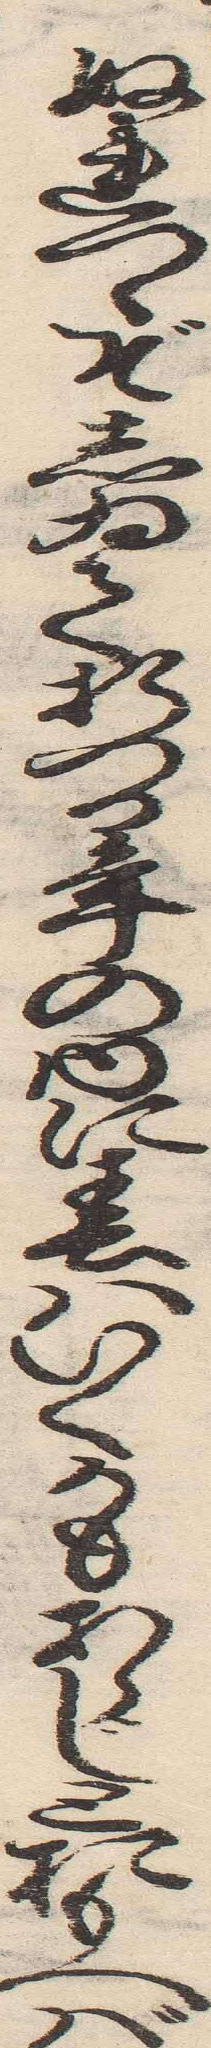古今ぬれつゝぞしゐて折つる年の内に春はいくかもあらじとおもへば
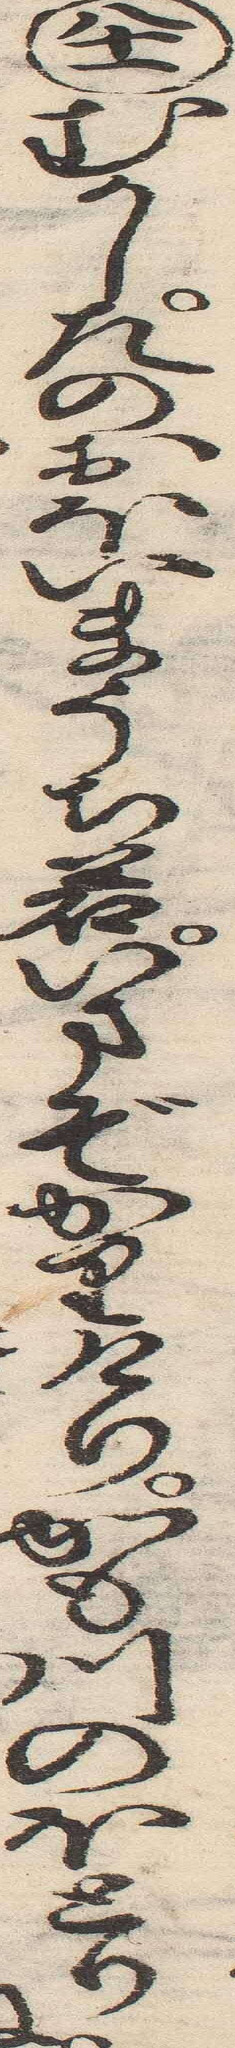八十一むかし。左のおほいまうち君。いまぞかりけり。かも川のほとりに。
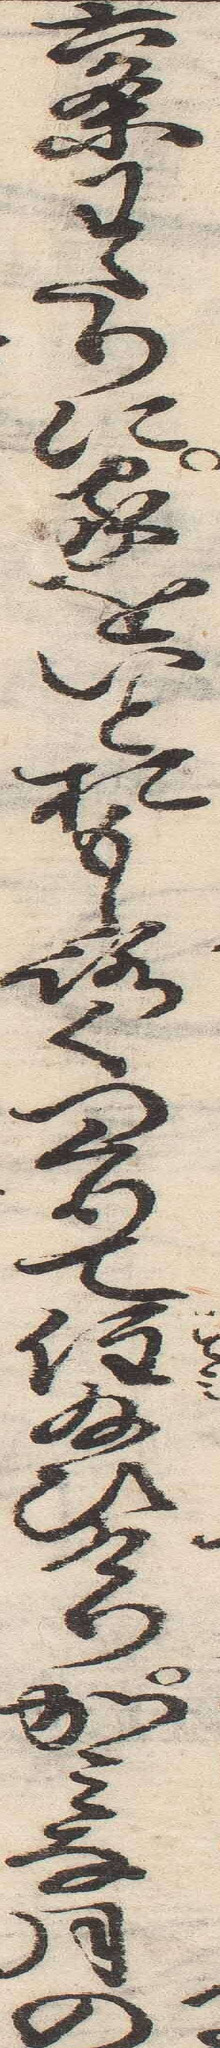六条わたりに。家をいとおもしろくつくりて住給ひけり。かみな月の
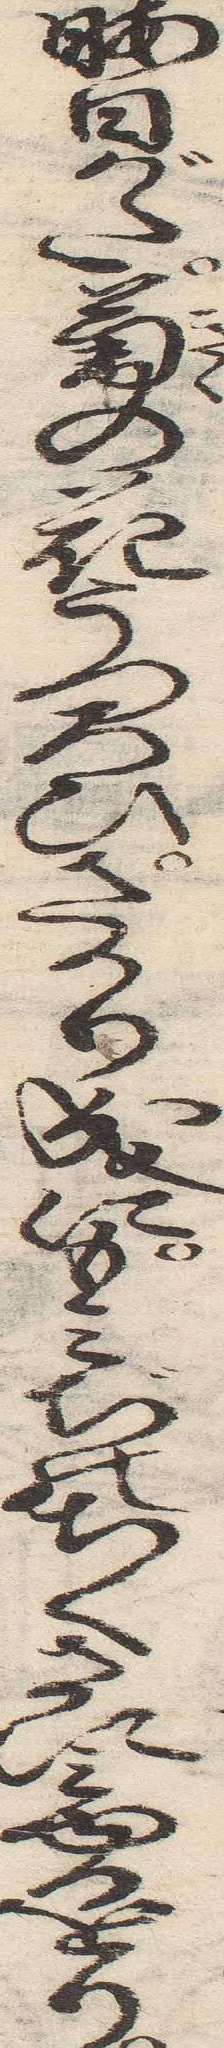晦日がた。菊の花うつろひ。さかり成に。もみぢのちくさにみゆるをり。
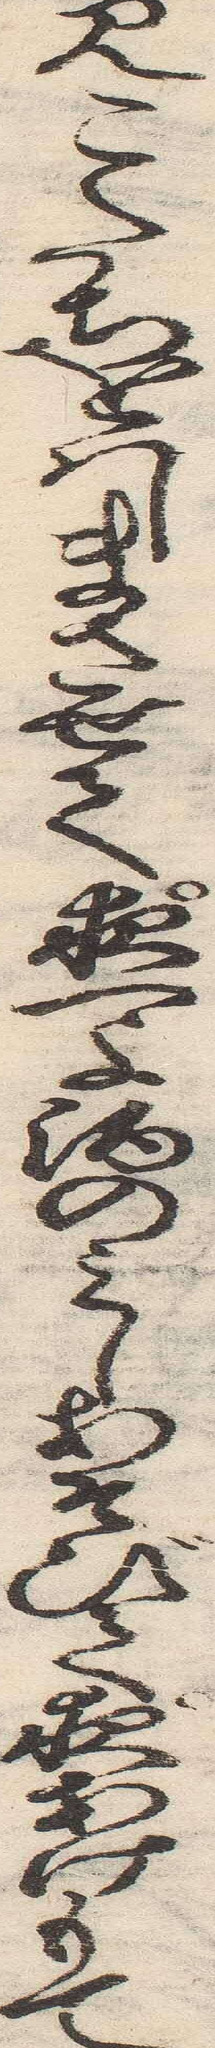みこたちをはしまさせて。夜一よ酒のみしあそびて。夜あけもて
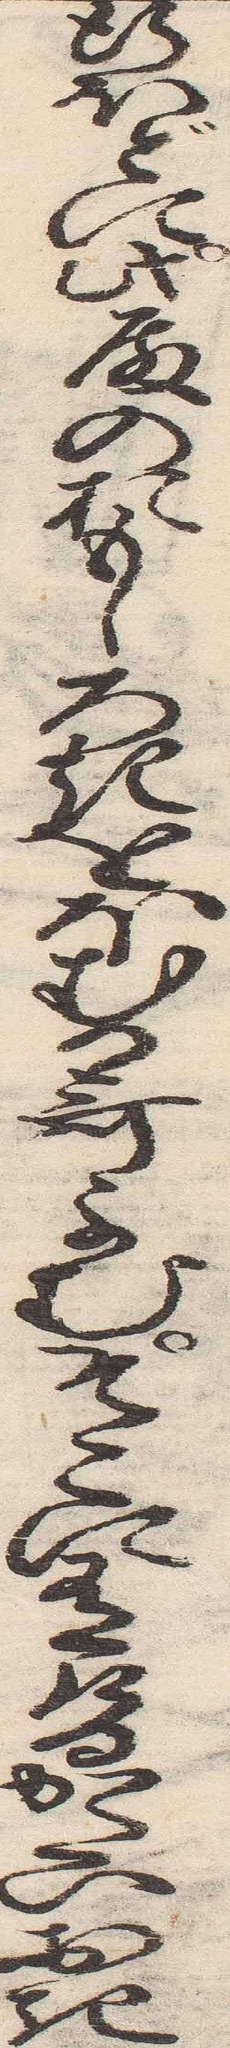行ほどに。此殿のおもしろきをほむる哥よむ。そこに有けるかたいおき
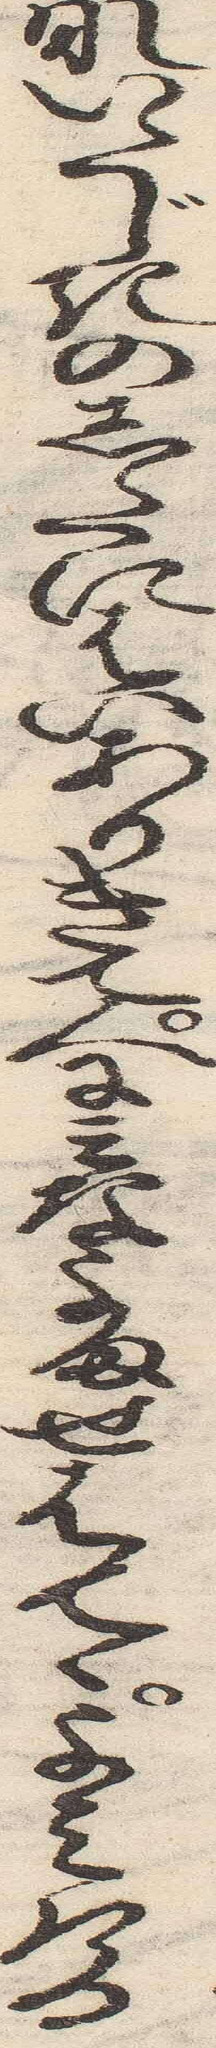ないたじきのしたにはいありきて。人にみなよませはてゝ。よみける
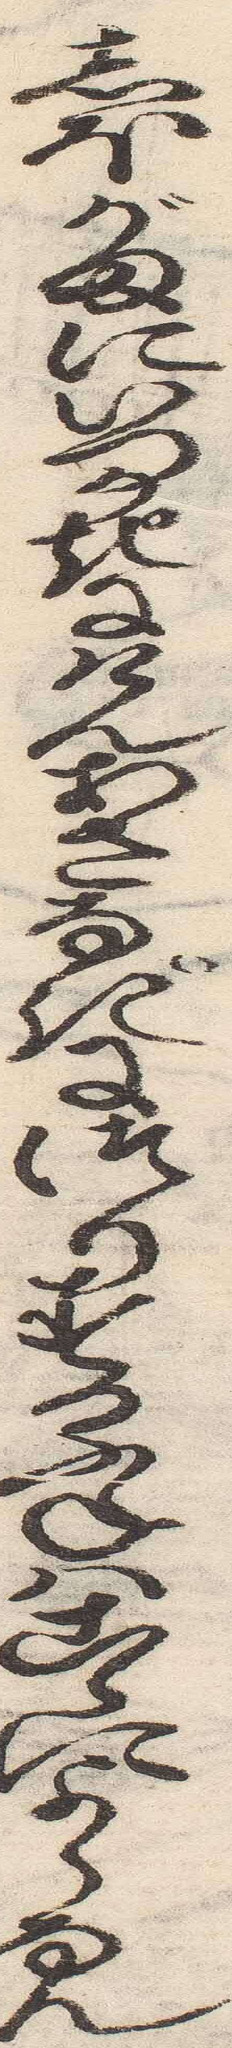しほがまにいつかきにけんあさなぎにつりするふねはこゝによらなん
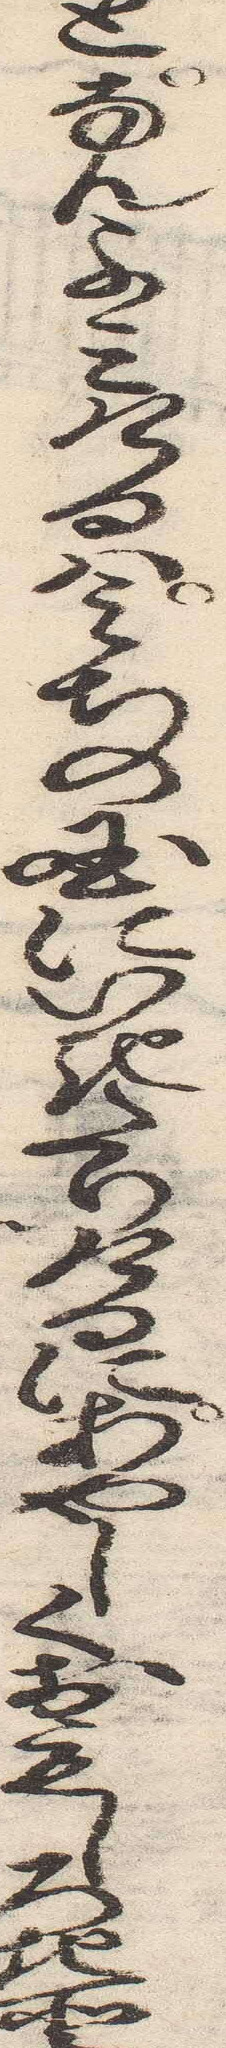と。なんよみけるは。みちの国にいきたりけるに。あやしくおもしろき所々
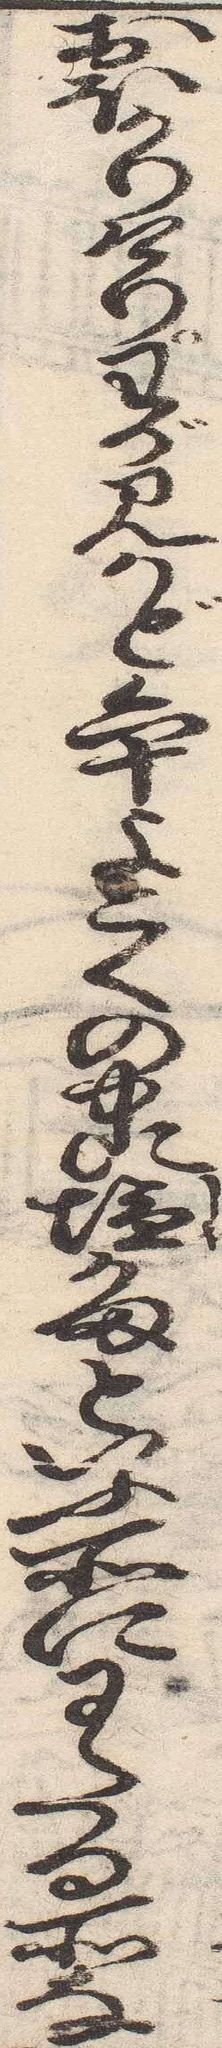おほかりけり。わがみかど六十よこくの中に塩かまといふ所ににたる所な
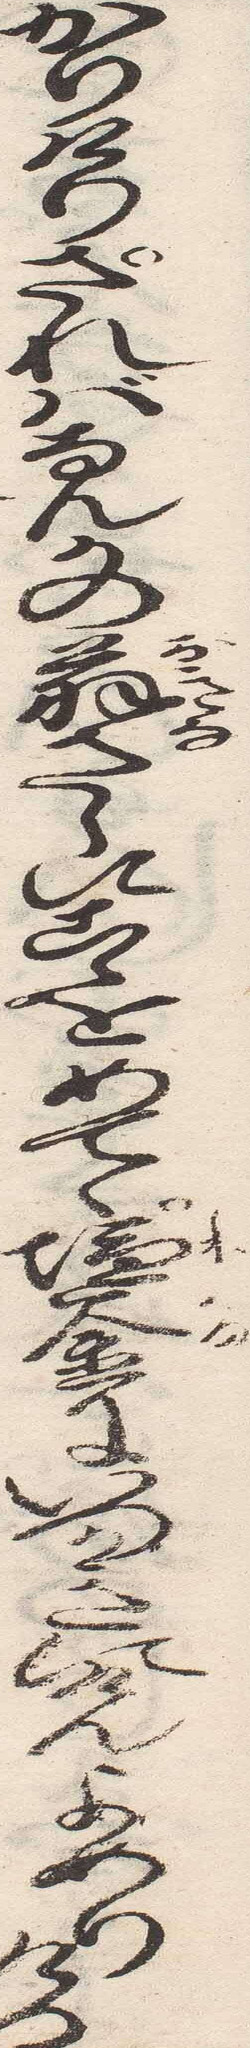かりけり。さればなんかの翁さらにこゝをめてゝ。塩釜にいつかきにけんよめりける
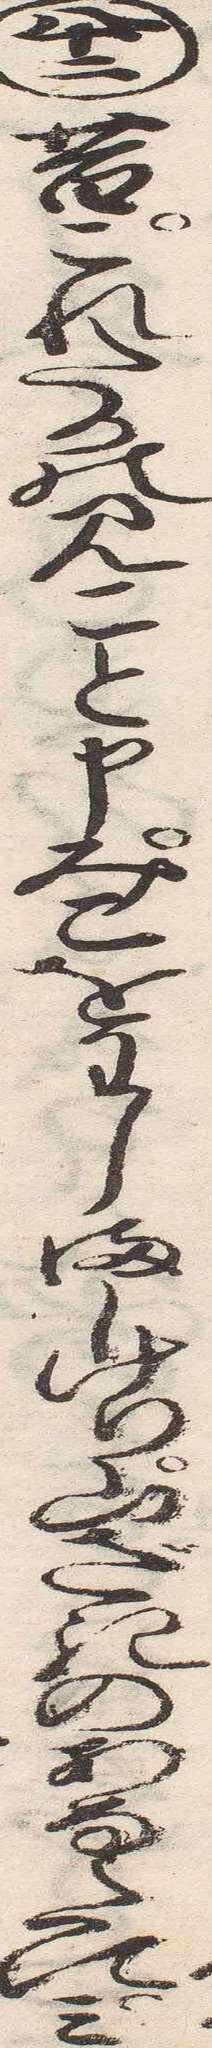八十二昔。これたかのみこと申。みこをわしましけり。山ざきのあなたに。み
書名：伊勢物語
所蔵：東京学芸大学附属図書館 国文学研究資料館
